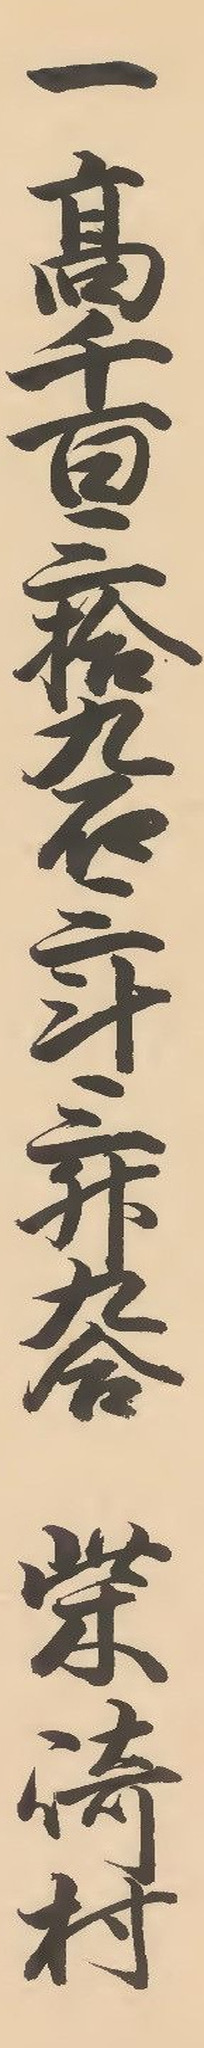一高千百三拾九石三斗三升九合柴崎村
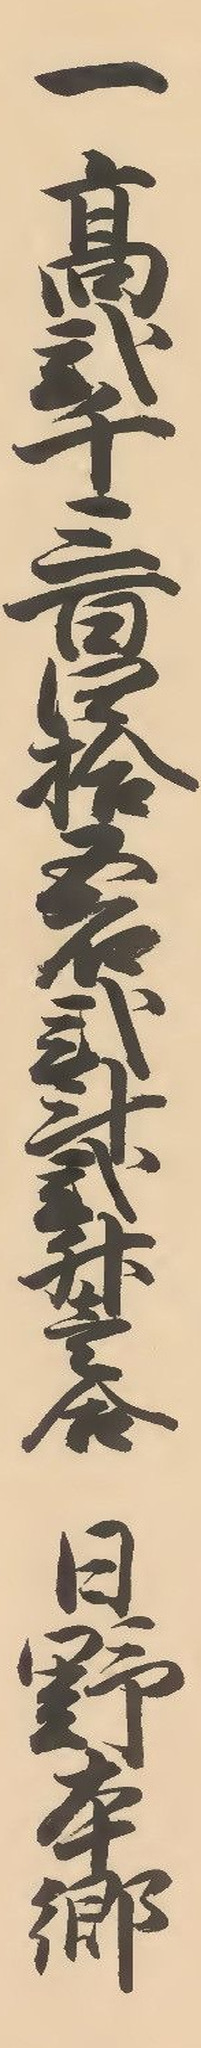一高弐千三百四拾五石弐斗弐升壱合日野本郷
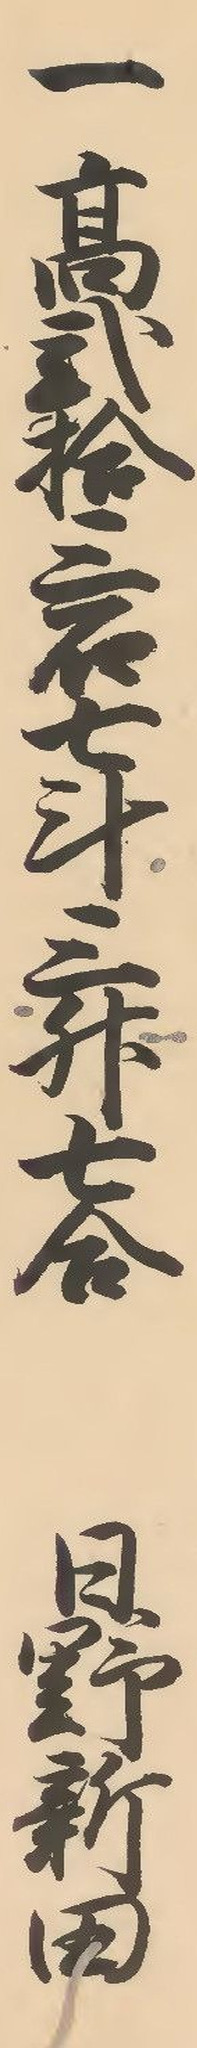一高弐拾三石七斗三升七合日野新田

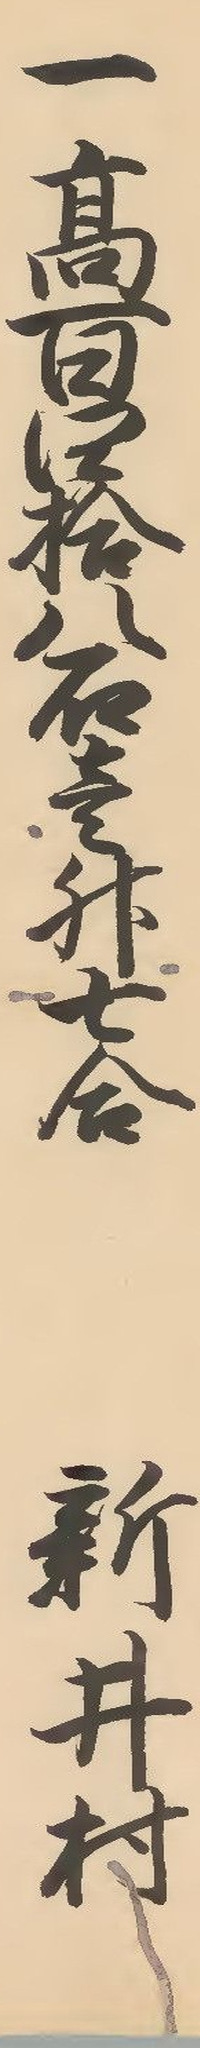一高百四拾八石壱升七合新井村
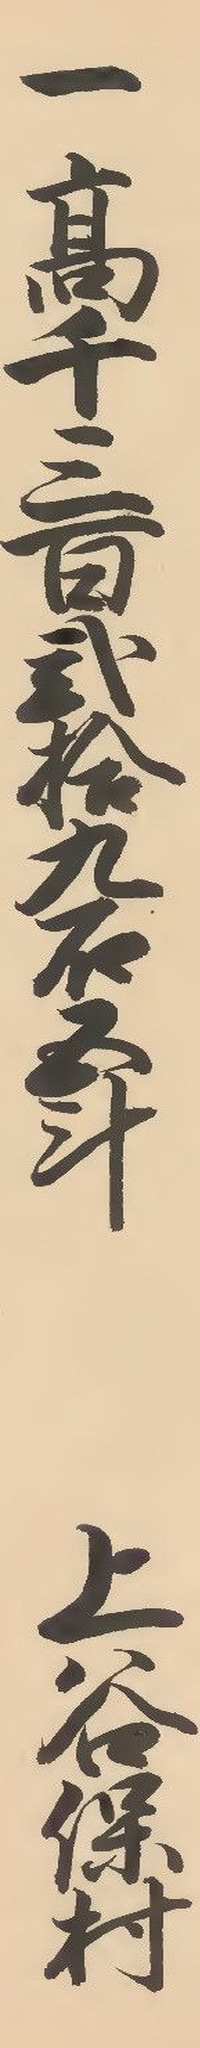一高千三百弐拾九石五斗上谷保村
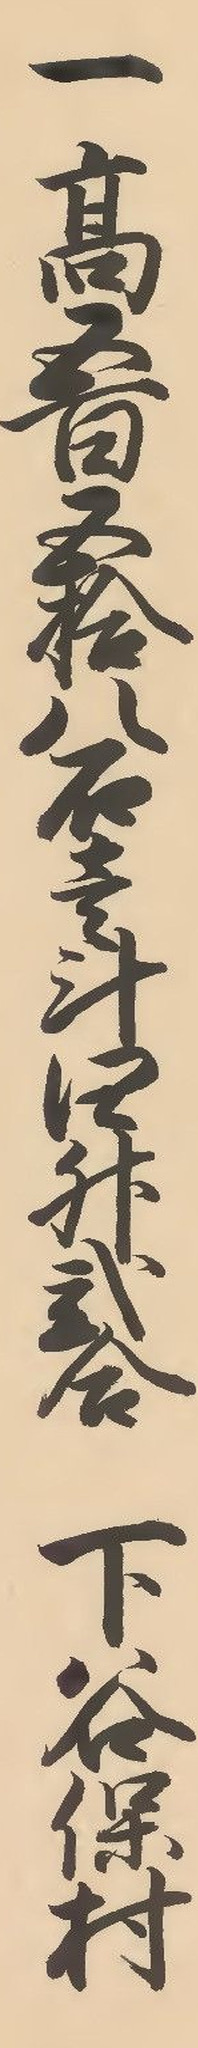一高五百五拾八石壱斗四升弐合下谷保村
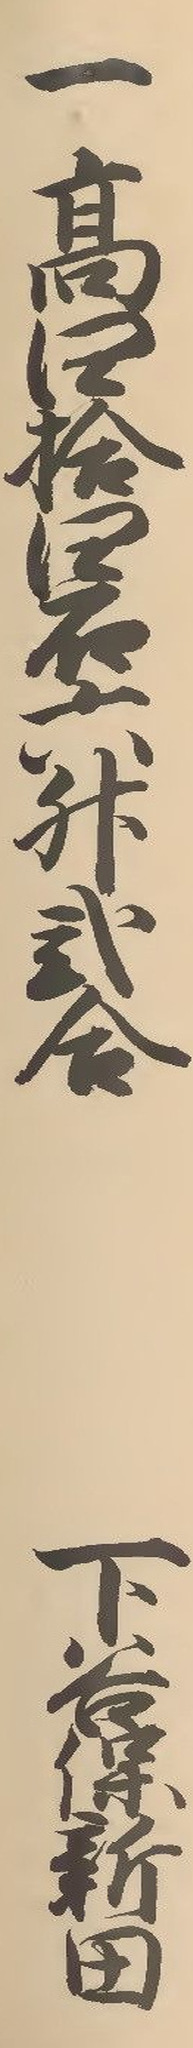一高四拾四石六升弐合下谷保新田
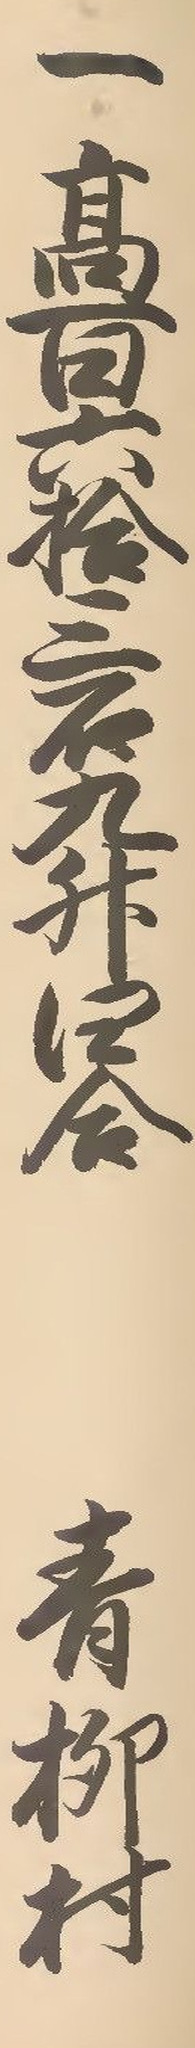一高百六拾三石九升四合青柳村
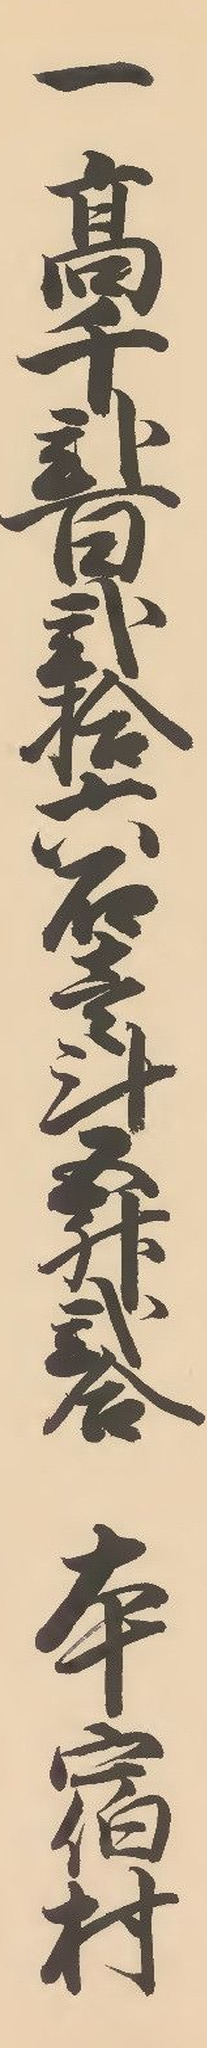一高千弐百弐拾六石壱斗五升弐合本宿村
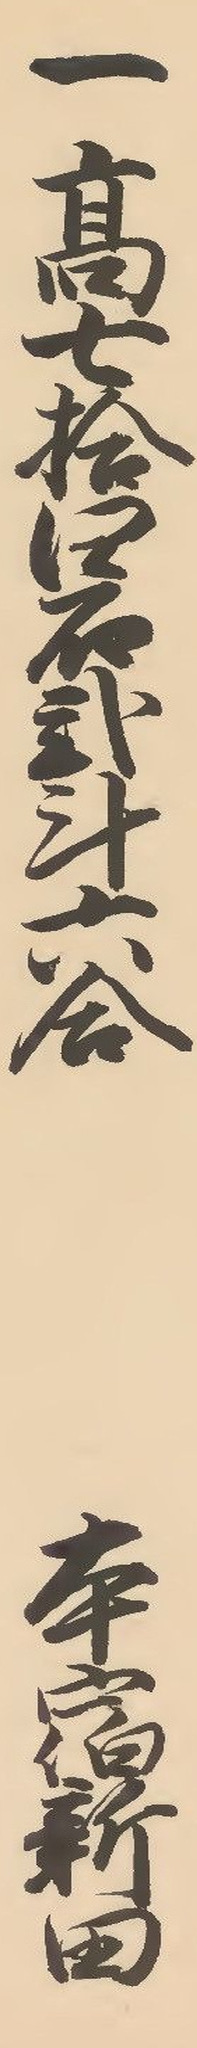一高七拾四石弐斗六合本宿新田
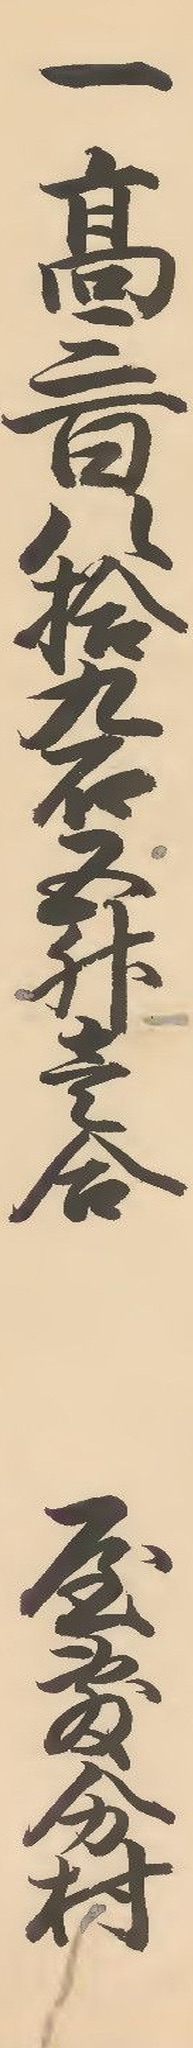一高三百八拾九石五升壱合屋敷分村

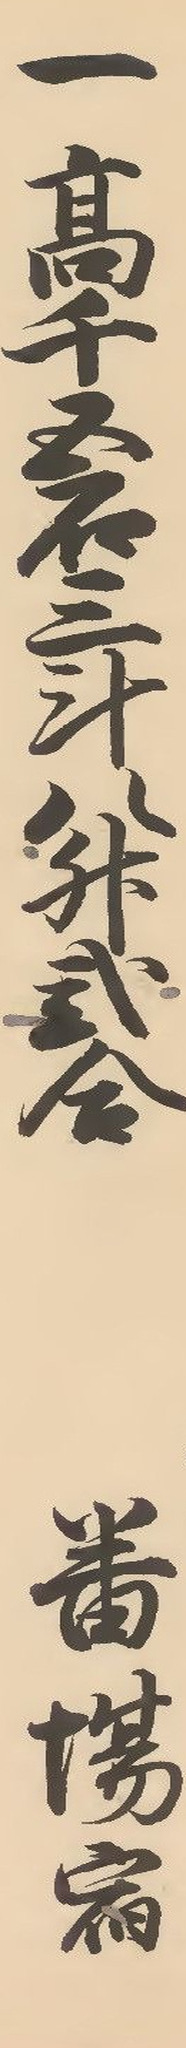一高千五石三斗八升弐合番場宿
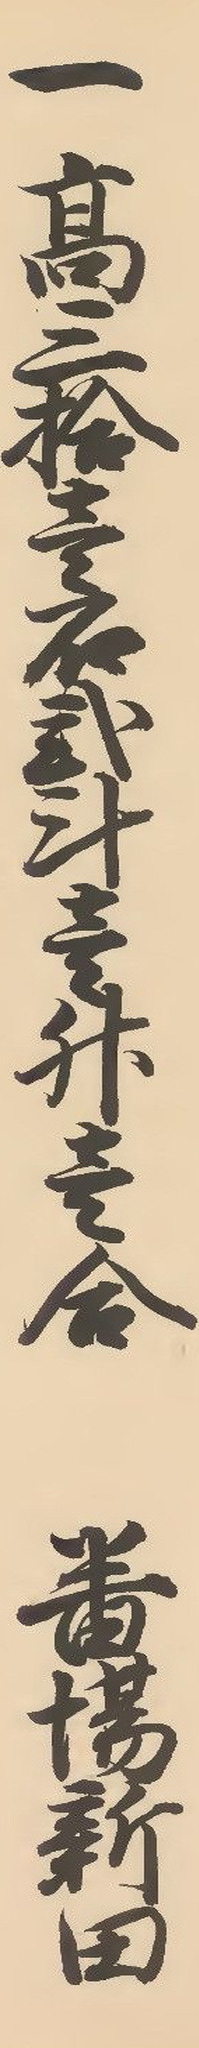一高三拾壱石弐斗壱升壱合番場新田
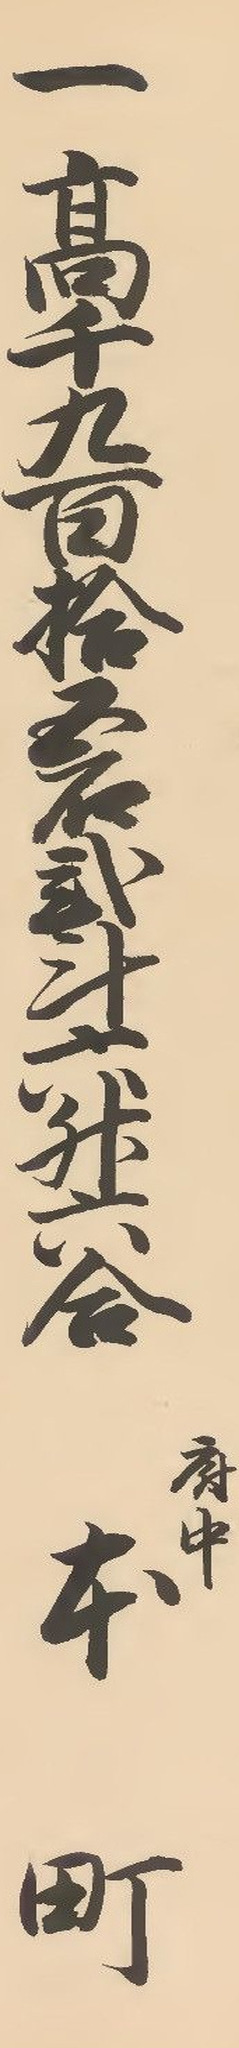一高千九百拾五石弐斗六升六合本町
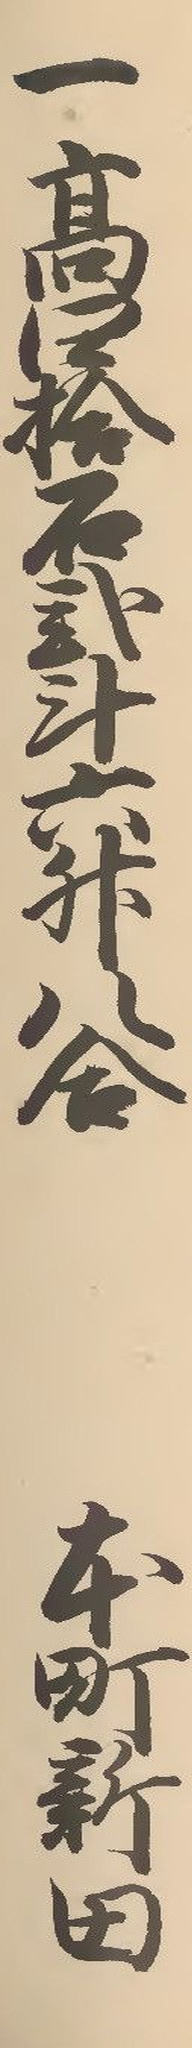一高四拾石弐斗六升八合本町新田
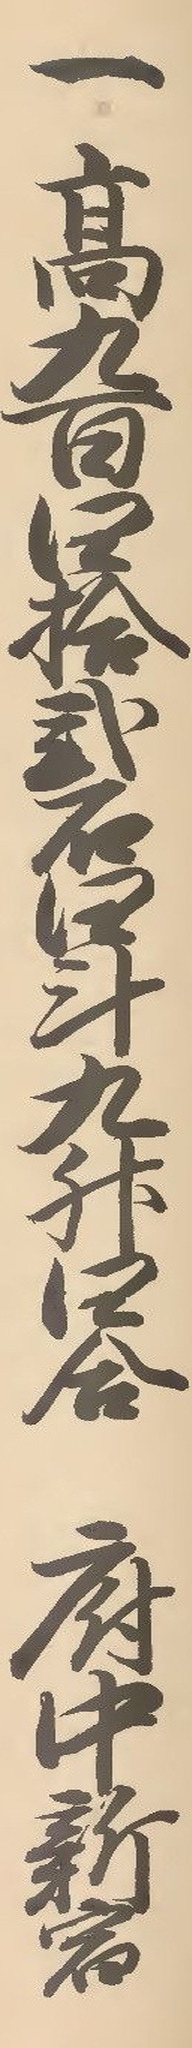一高九百四拾弐石四斗九升四合府中新宿
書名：武蔵国郷帳　上
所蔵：国立公文書館 National Archives of Japan
